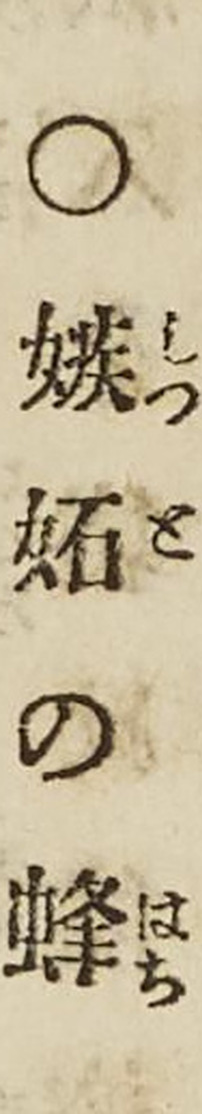○嫉妬の蜂
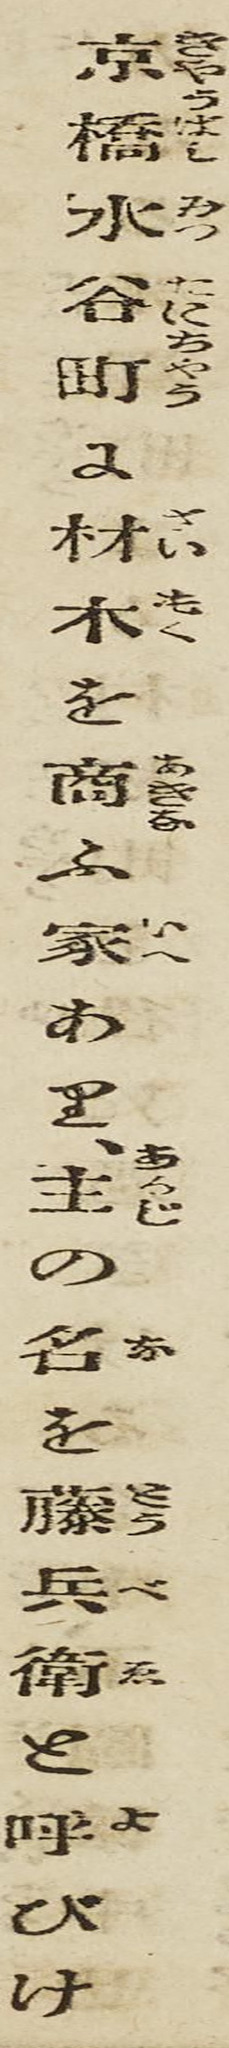京橋水谷町に材木を商ふ家あり、主の名を藤兵衛と呼びけ
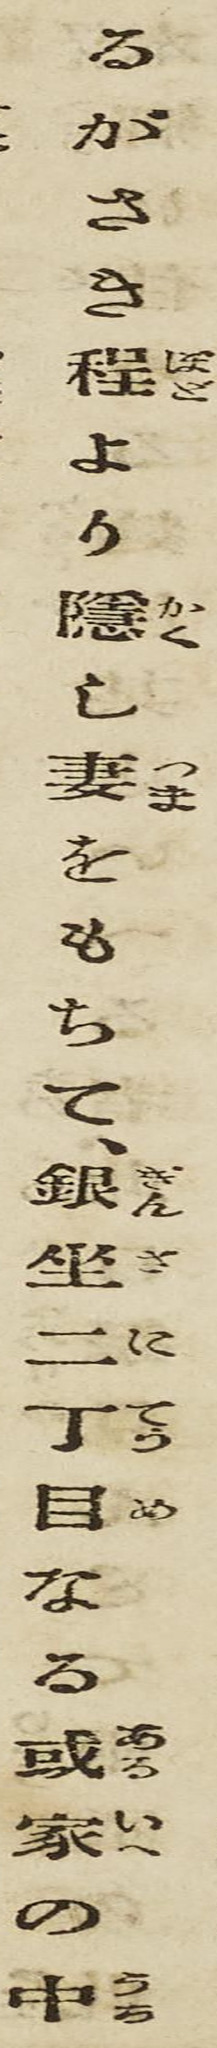るがさき程より隠し妻をもちて、銀座二丁目なる或家の中
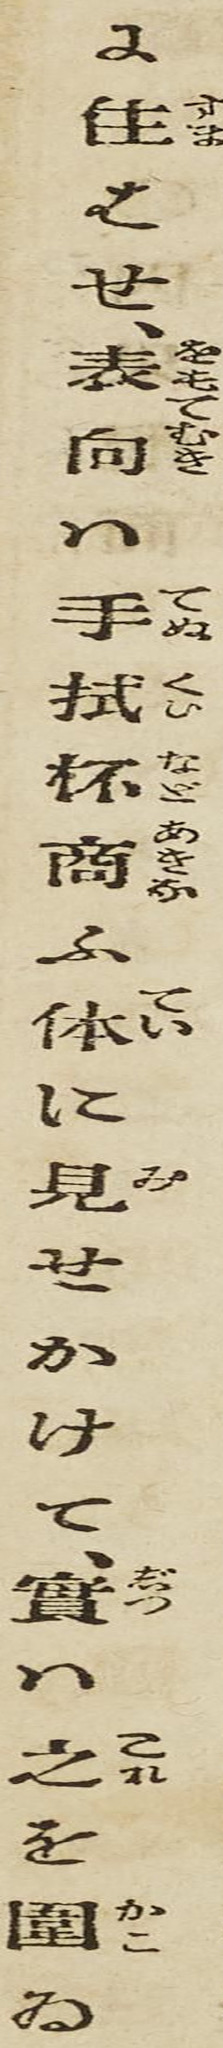に住はせ、表向は手拭等商ふ体に見せかけて、実は之を囲ゐ
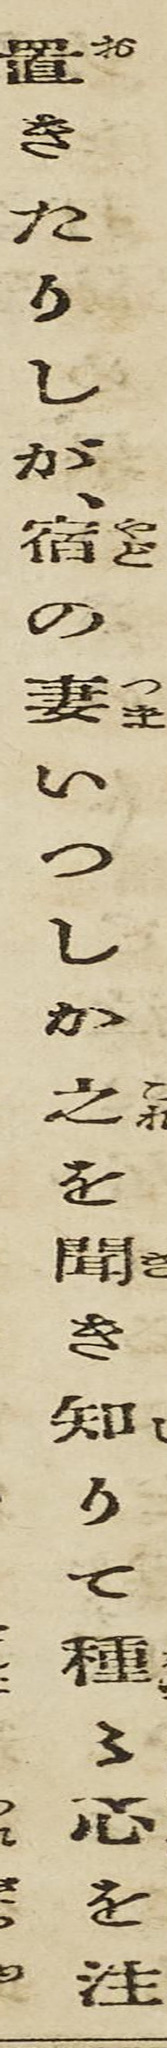置きたりしが、宿の妻のいつしか之を聞き知りて種〻心を注
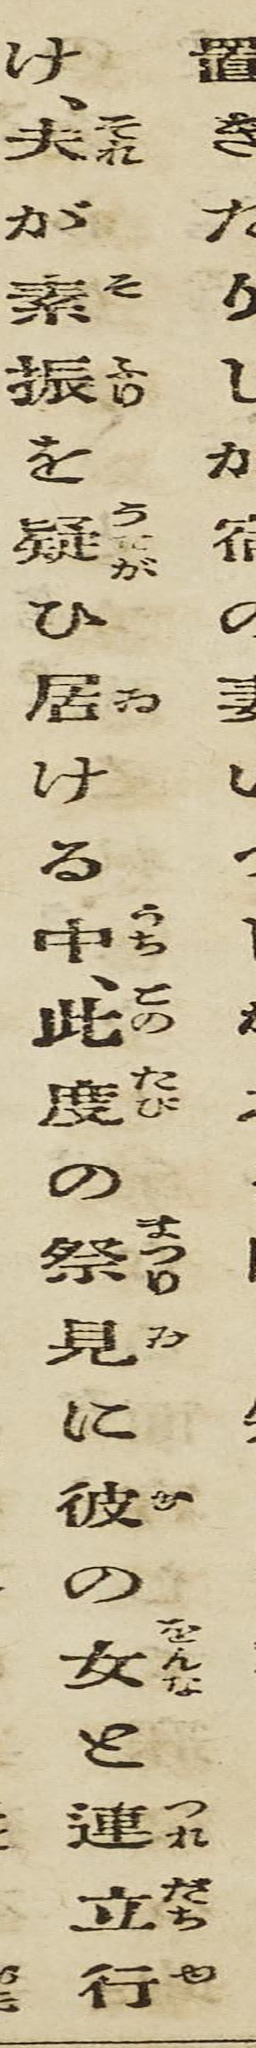け、夫が素振を疑ひ居ける中、此度の祭見に彼の女と連立行
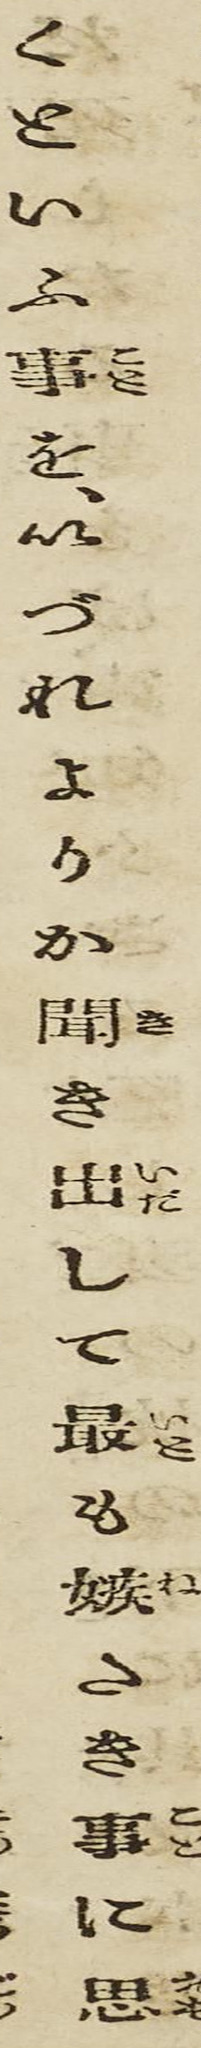くといふ事を、いづれよりか聞き出して最も嫉たき事に思
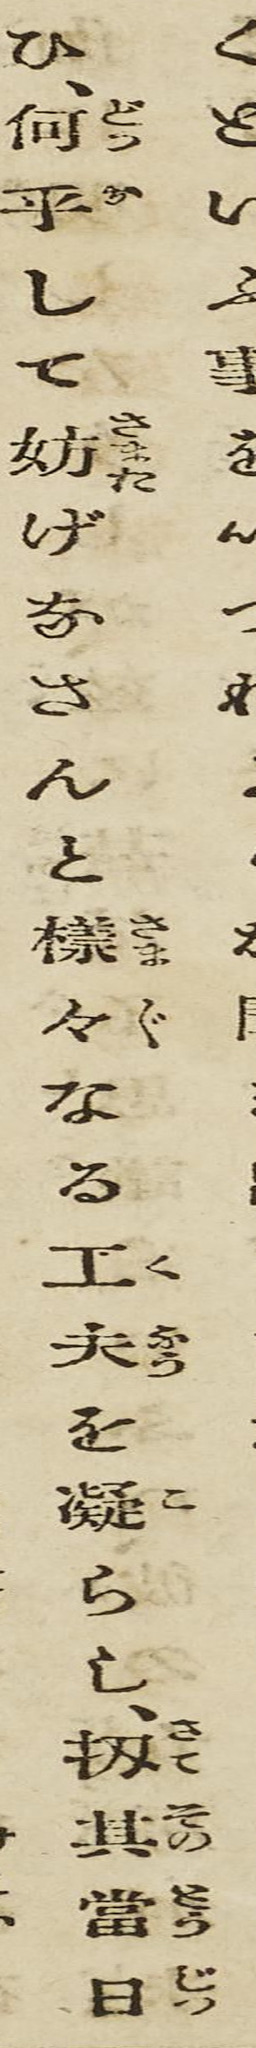ひ何乎して妨げなさんと様々なる工夫を凝らし、扨其当日
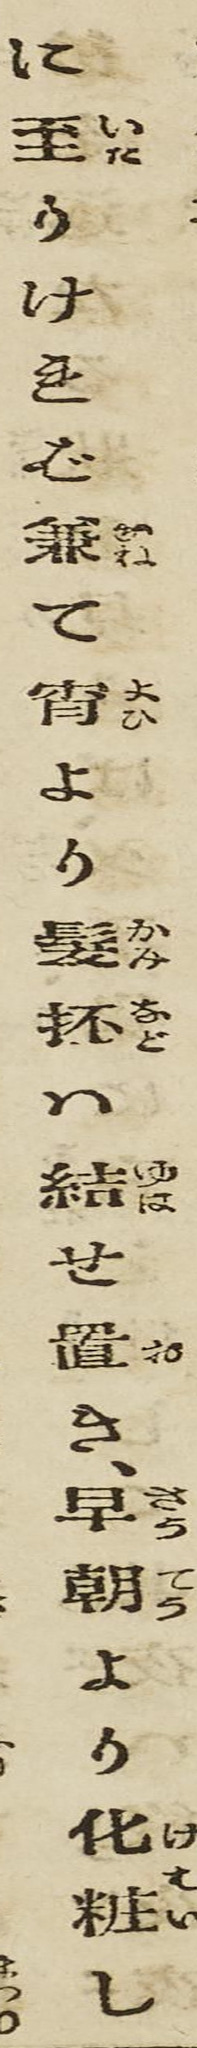に至りければ兼て宵より髪抔は結せ置き、早朝より化粧し
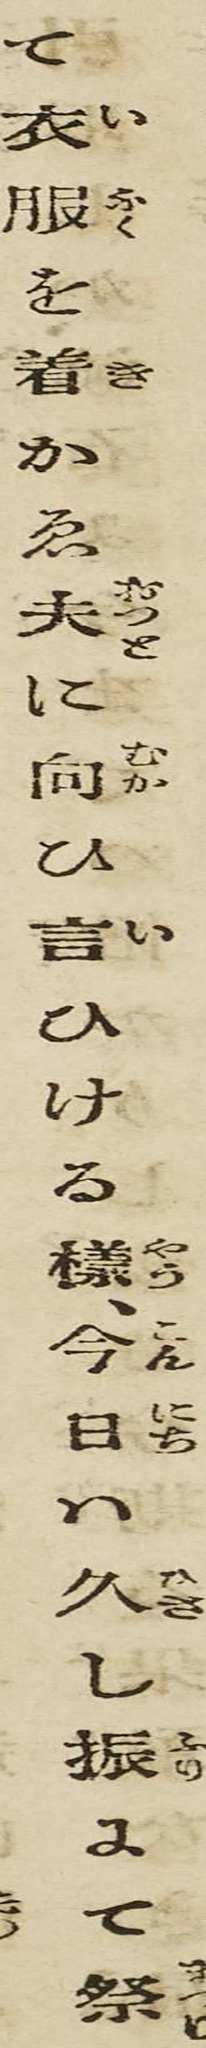て衣服を着かゑ夫に向ひ言ひける様、今日は久し振にて祭
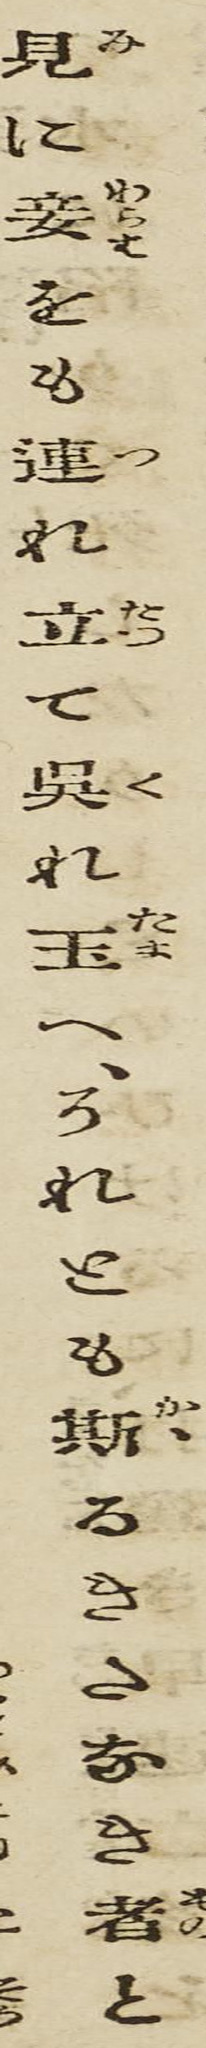見に妾をも連れ立て呉れ玉へ、それとも斯るきたなき者と
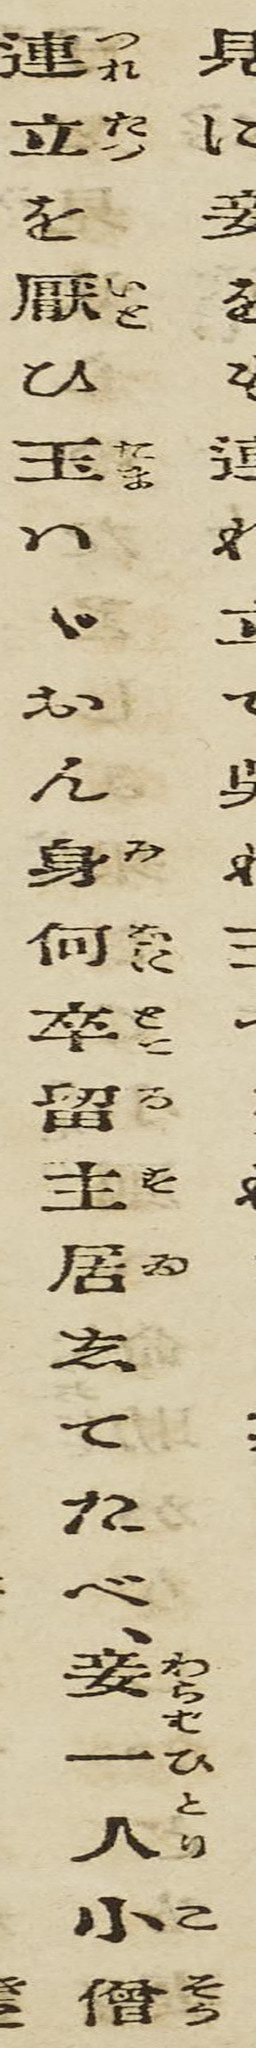連立を厭ひ玉はゞおん身何卒留守居してたべ、妾一人小僧
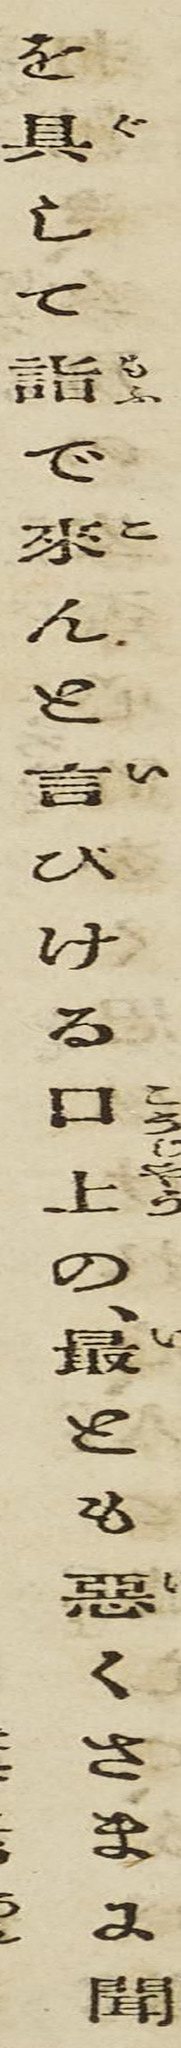を具して詣で来んと言ひける口上の、最とも悪くさまに聞
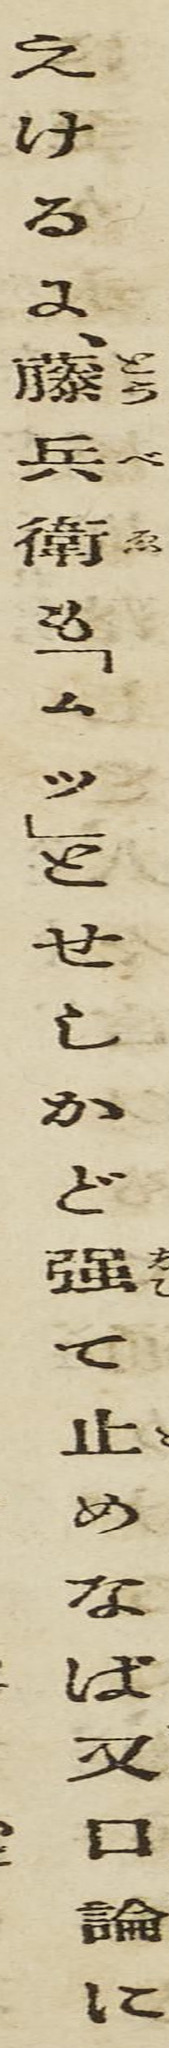えけるに、藤兵衛も「ムツ」とせしかど強て止めなば又口論に
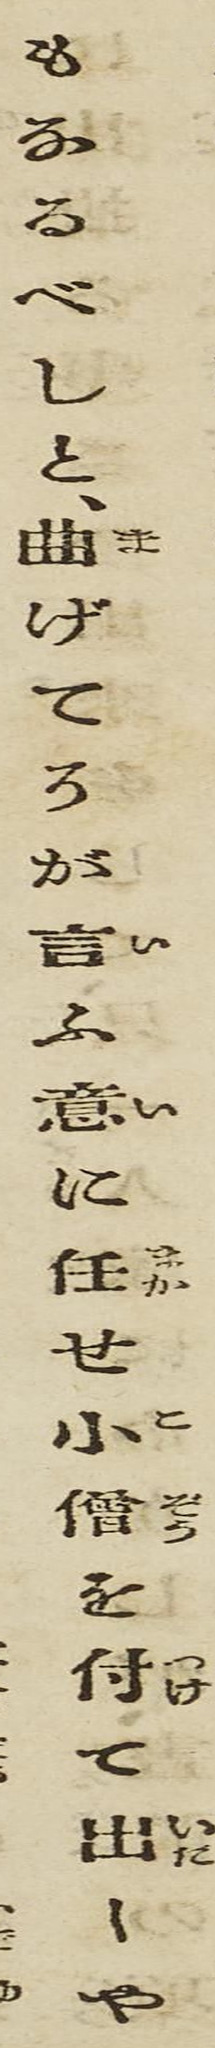もなるべしと、曲げてそが言ふ意に任せ小僧を付て出しや
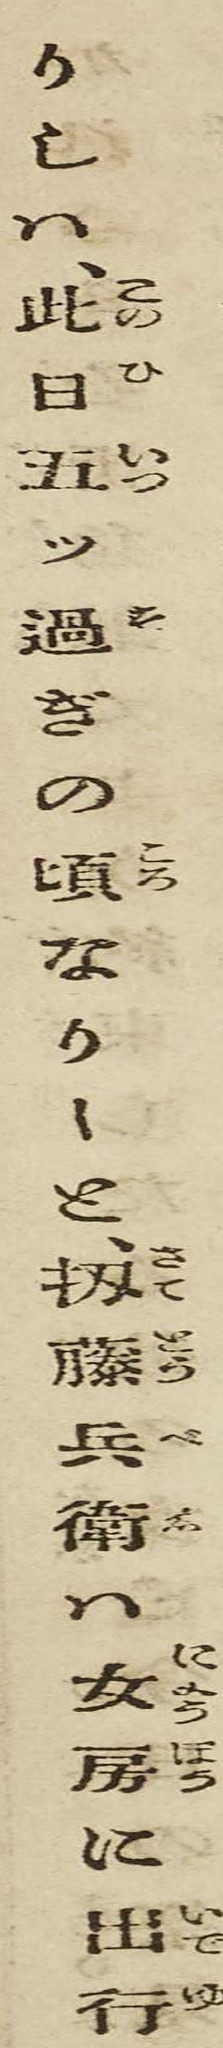りしは、此日五ツ過ぎの頃なりしと、扨藤兵衛は女房に出行
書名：永代惨話　文化の夢　全
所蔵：東京大学地震研究所図書室 Earthquake Research Institute Library, The University of Tokyo, JAPAN
